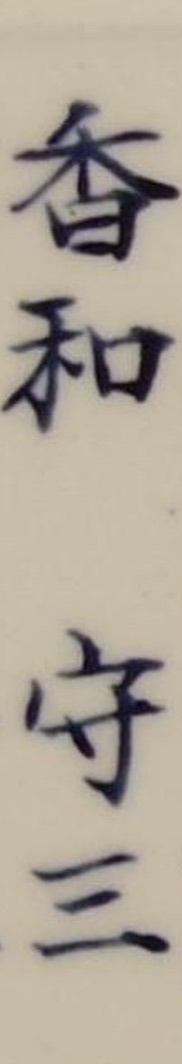香和守三
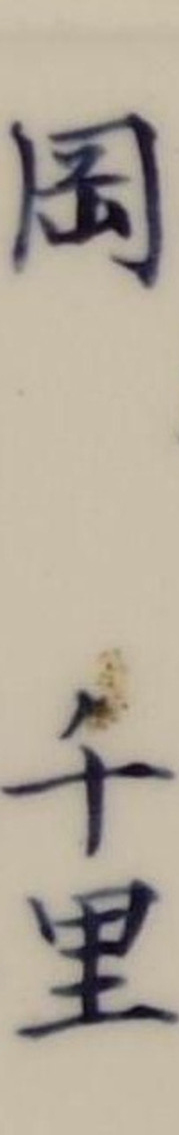岡千里

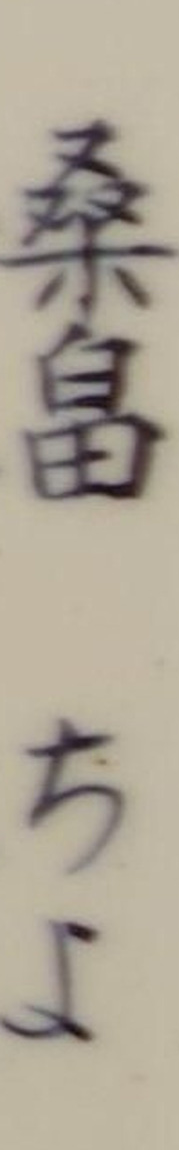桑畠ちよ
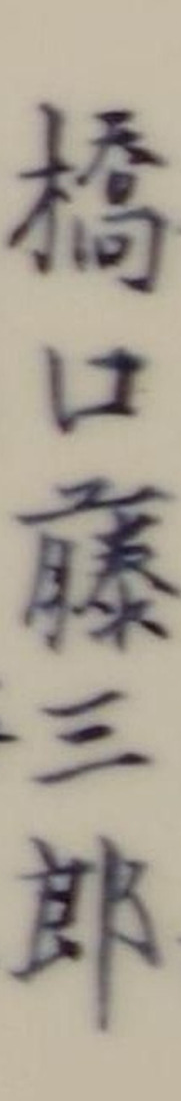橋口藤三郎
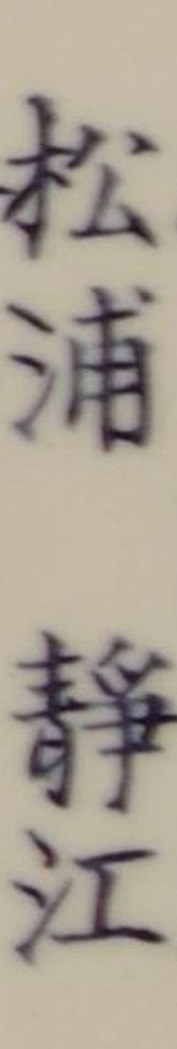松浦静江
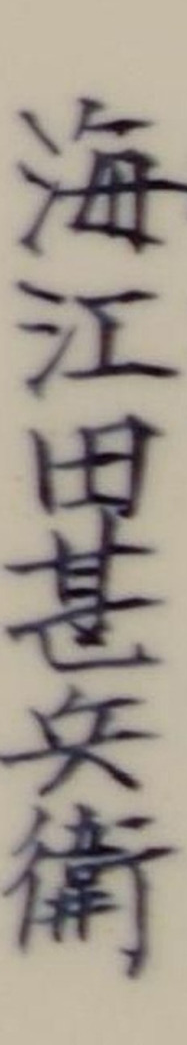海江田甚兵衛
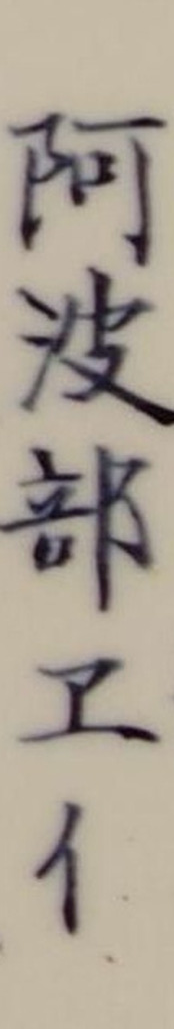阿波部ヱイ
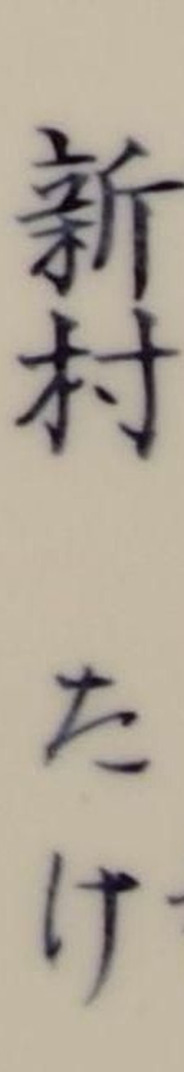新村たけ
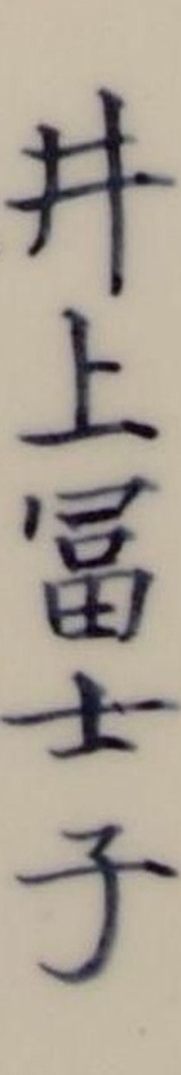井上冨士子
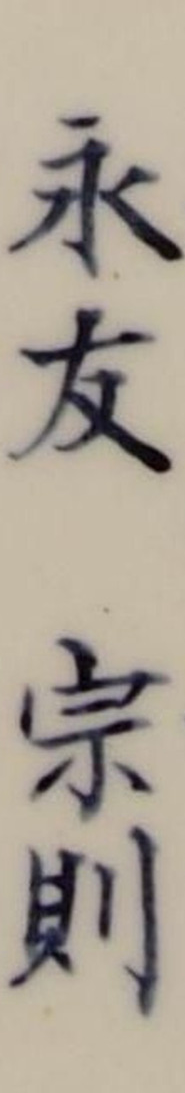永友宗則
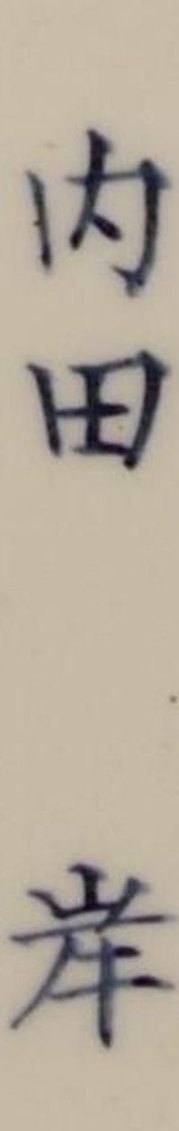内田岸
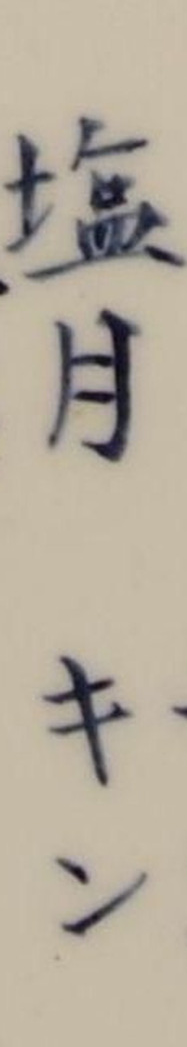塩月キン
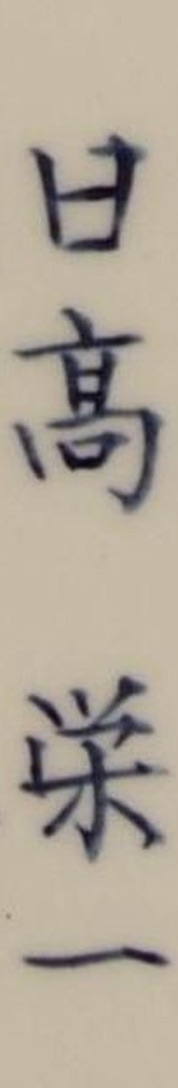日高栄一
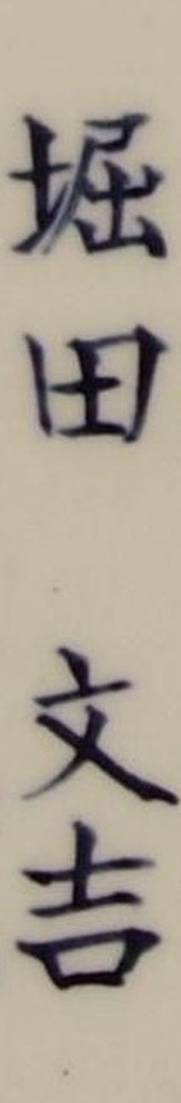堀田文吉
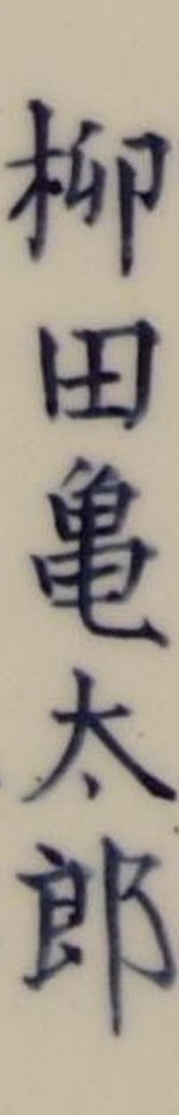柳田亀太郎
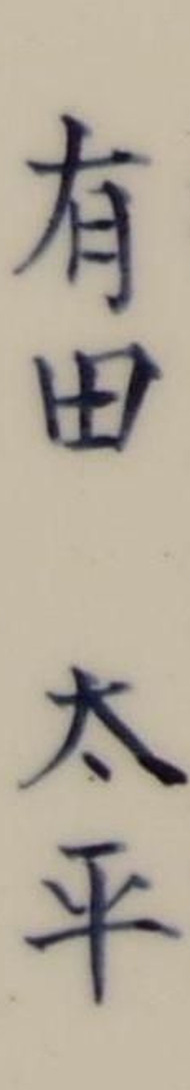有田太平
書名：E~L
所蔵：高野山金剛峯寺
